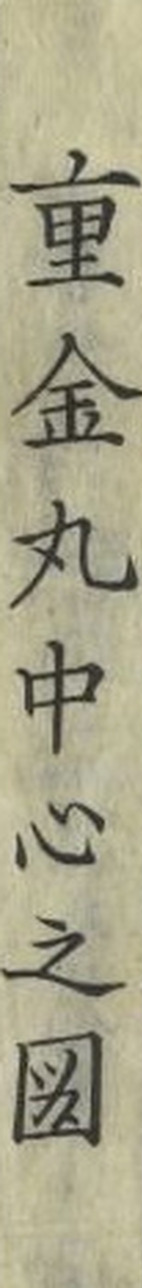重金丸中心之図
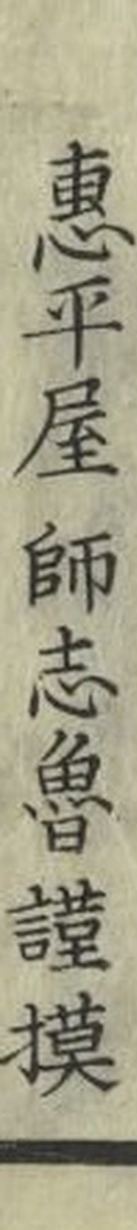惠平屋師志魯謹摸
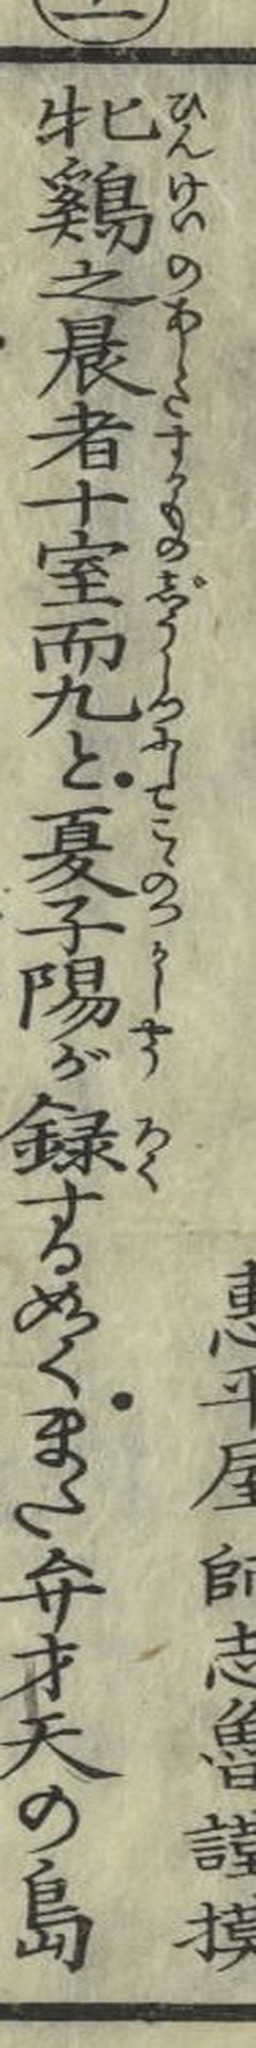牝鷄之晨者十室而九と・夏子陽が録する如く・また弁才天の島
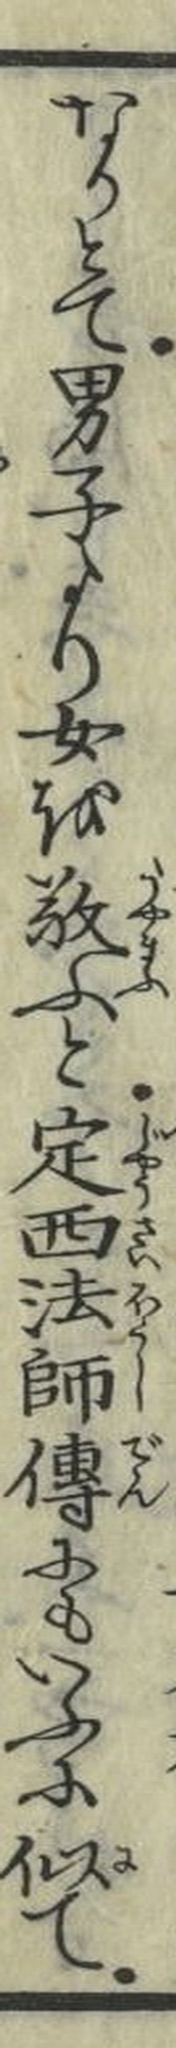なりとて・男子より女を敬ふと・西定法師傳にもいふに似て
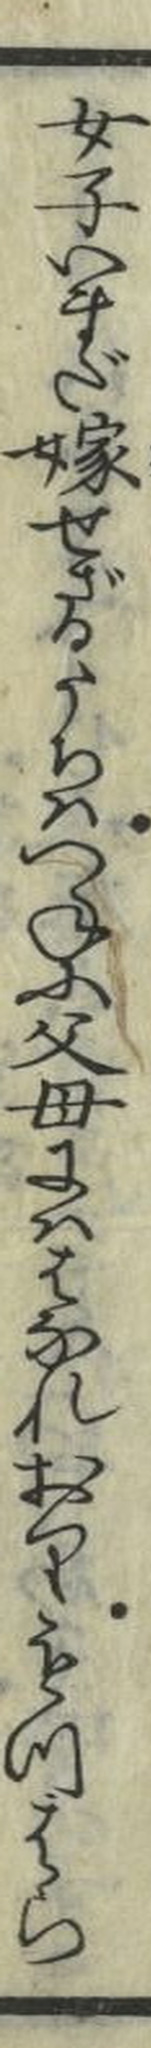女子いまだ嫁せざるうちは・つねに父母にははなれおり・もつはら
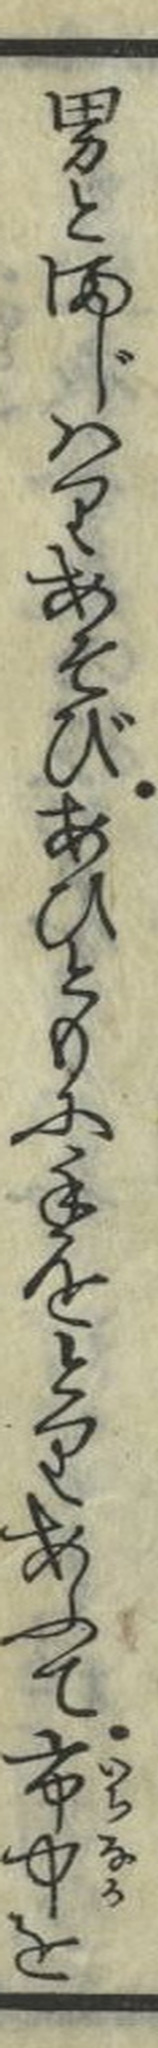男とまじはりあそび・あひともに手をとりあふて・市中を
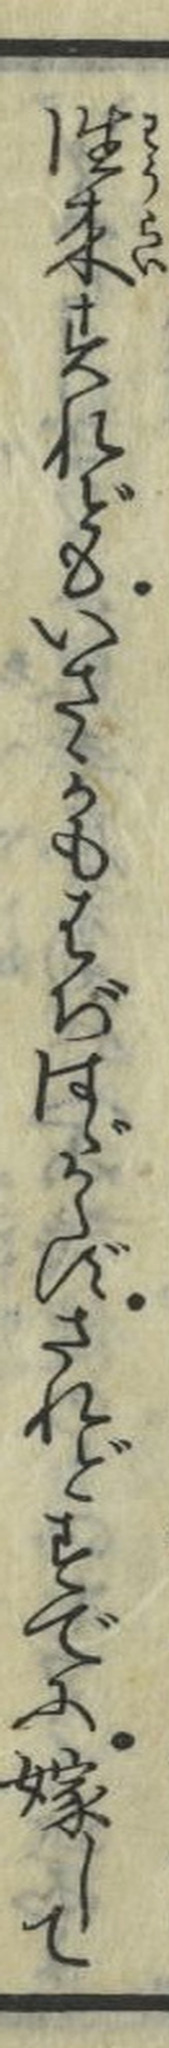往來すれども・いさゝかもはぢはゞからず・されどすでに・嫁して
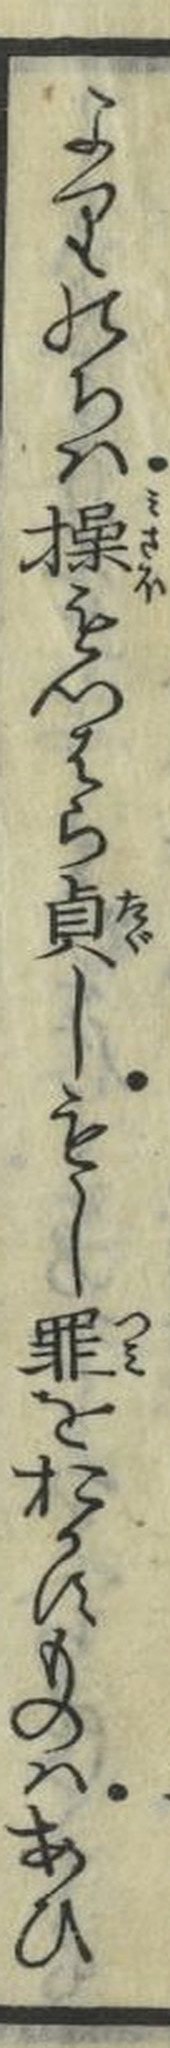よりならは・操もつはら貞し・もし罪をおかすものは・あひ
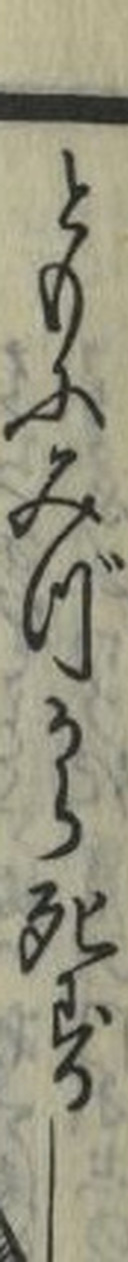ともにみづから死す
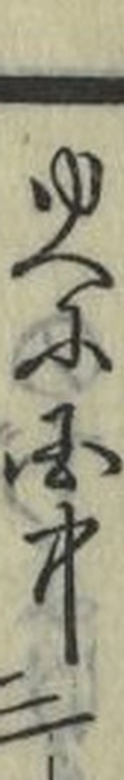ゆへに国中
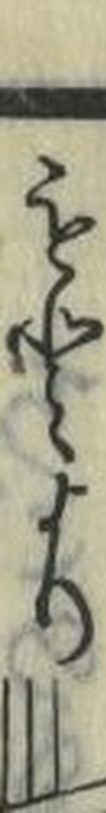もとより
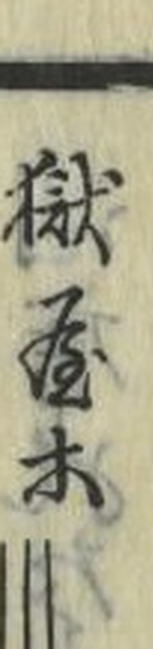獄屋等
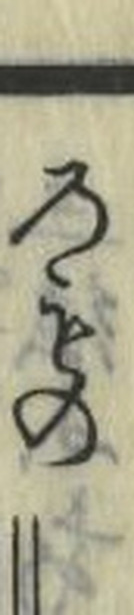のもの
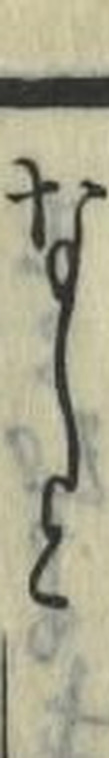なしと
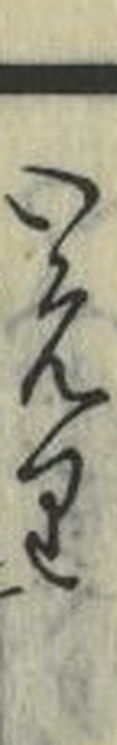いえり

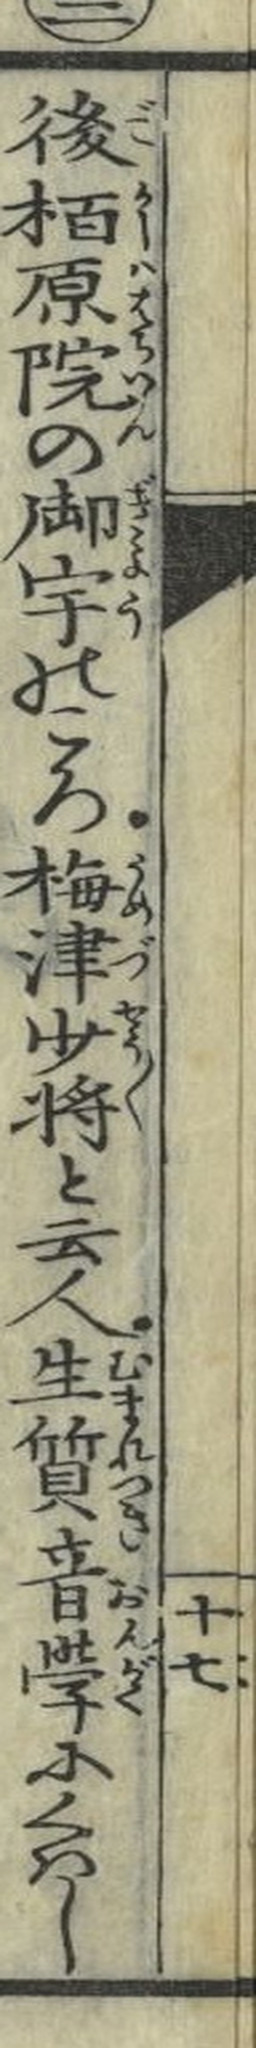後栢原院の御宇のころ・梅津少將と云人・生質音學にくはし
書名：琉球秊代記 附雑話 全
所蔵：University of the Ryukyus Library
